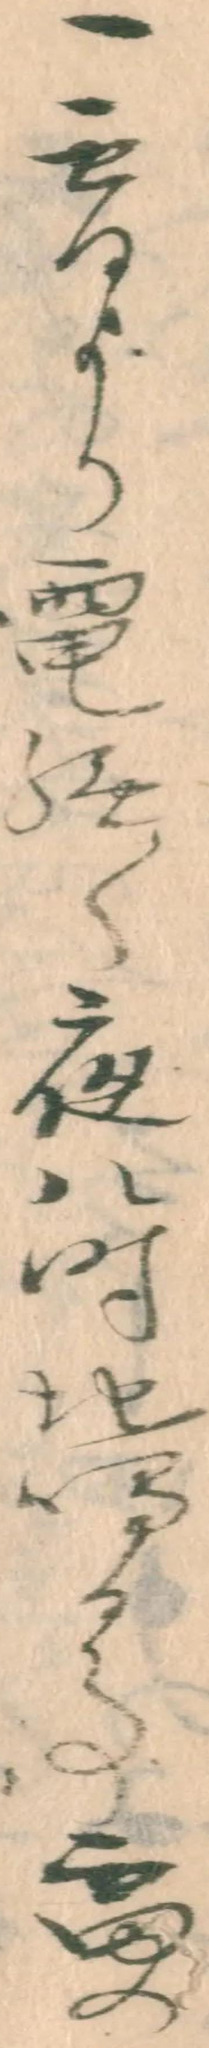一宵より電強く夜八時地鳴る事雷の
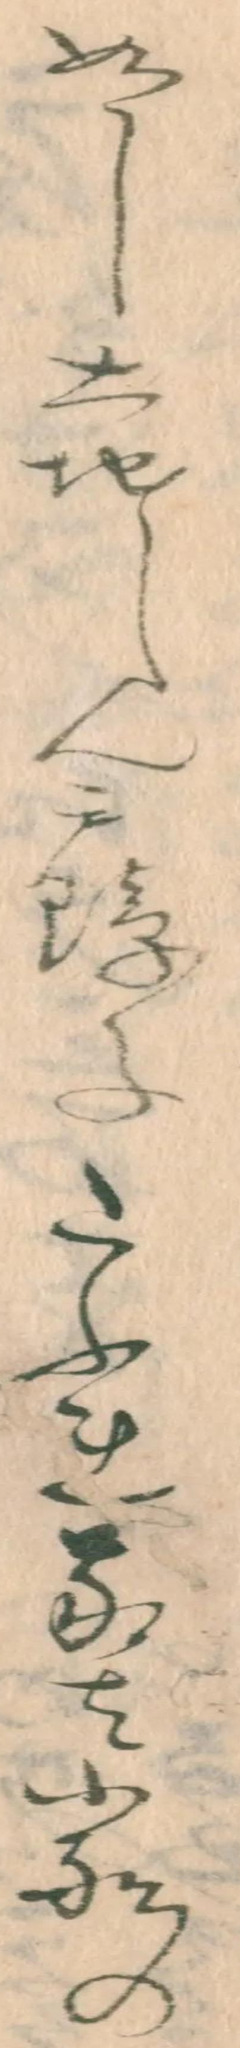如し大地しん戸障子たふれ家は小船の
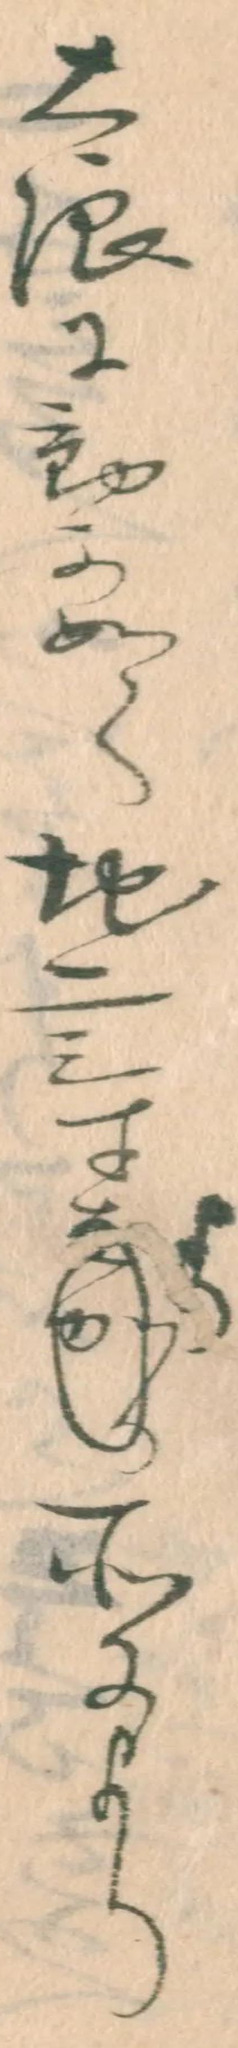大浪に動か如く地二三寸所により
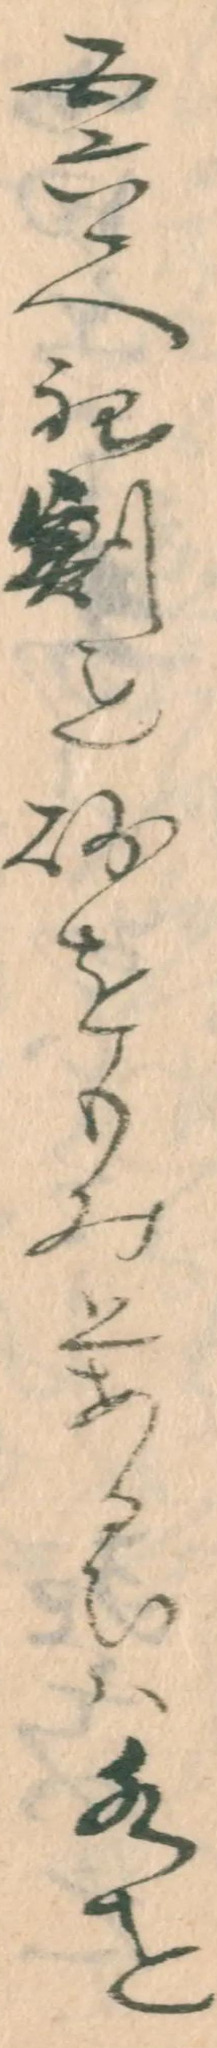五六尺程割れ砂をもみ上あるひは水を
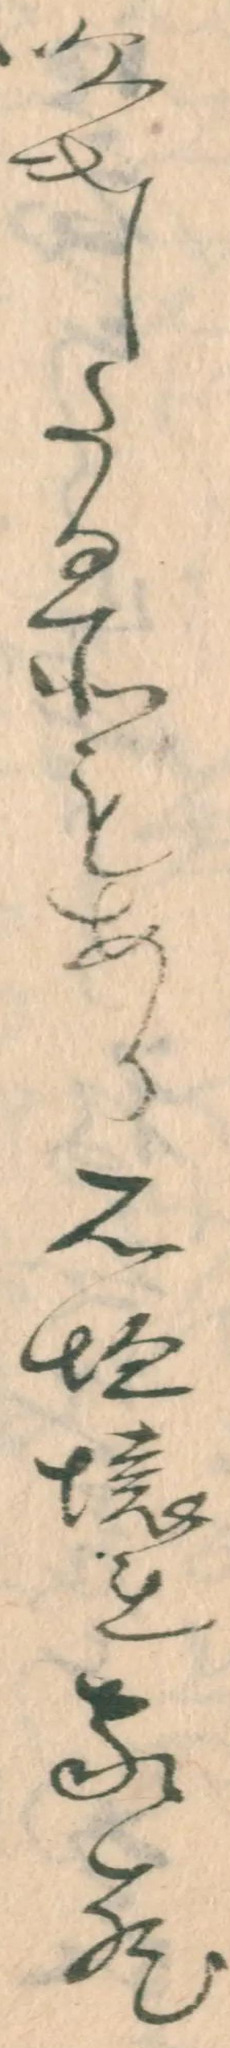吹出したる所もあり石垣壊れ家蔵
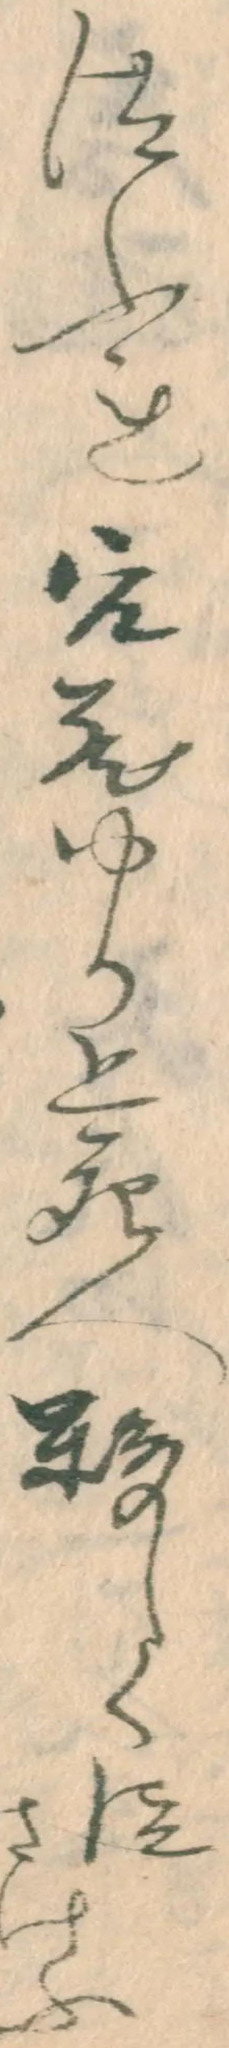つふれ穴蔵ゆり上死人夥しく泣さけふ
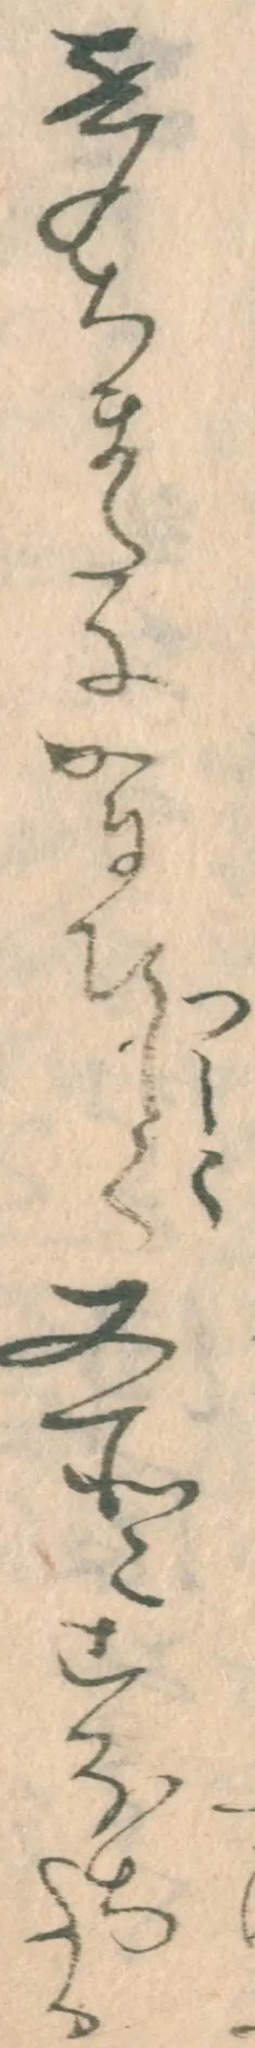声ちまたにかまひしく又所々こほちたる

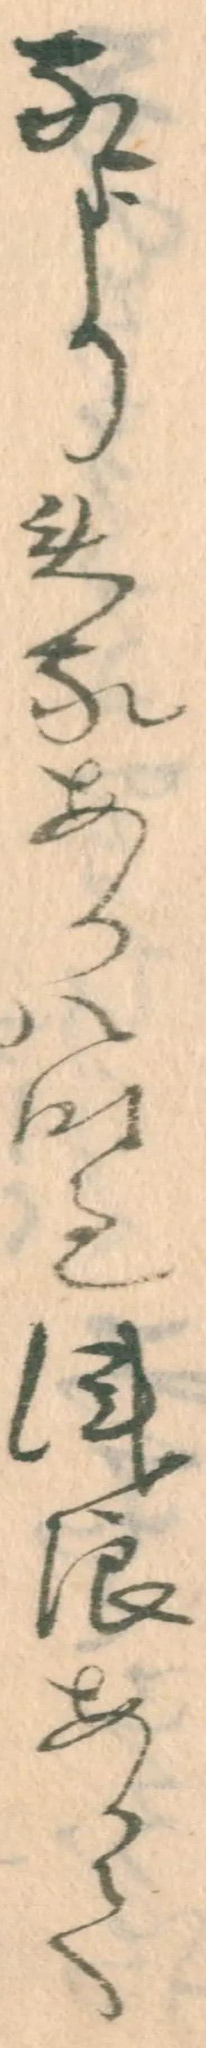家より失火あり八時過津浪ありて
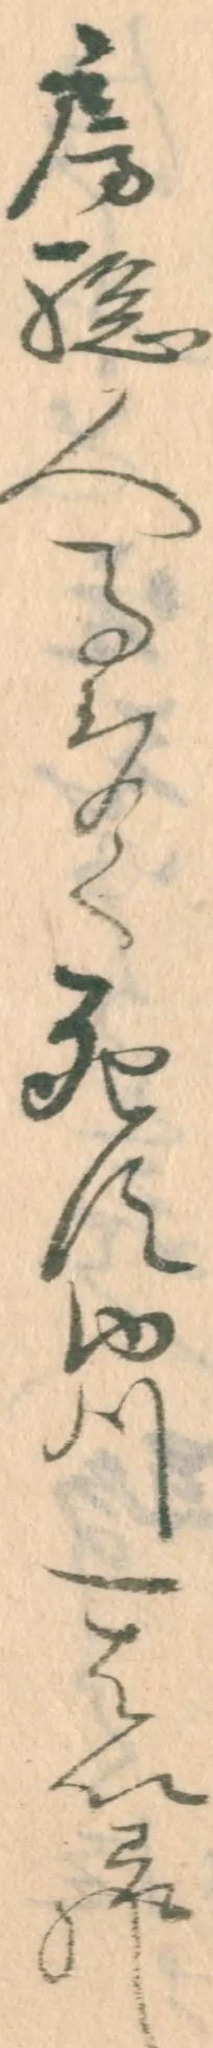房総人馬多く死す由川一はい差引
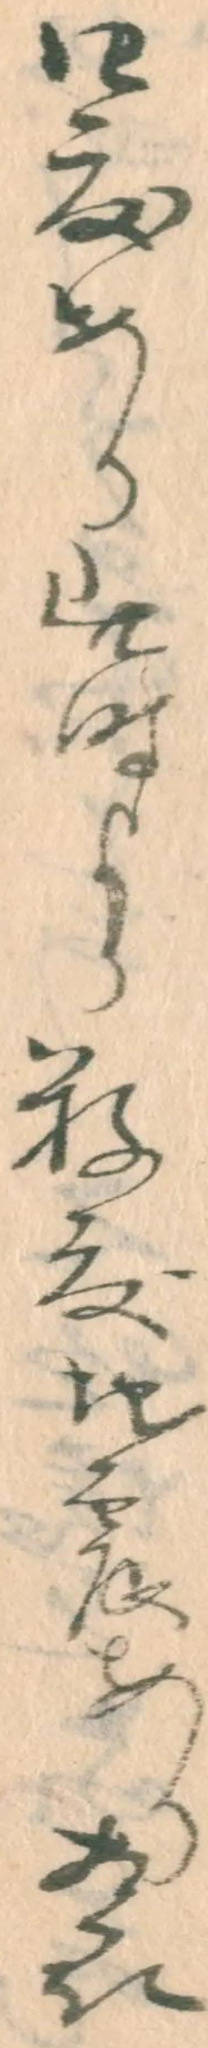四度あり此時より数度地震あり相州
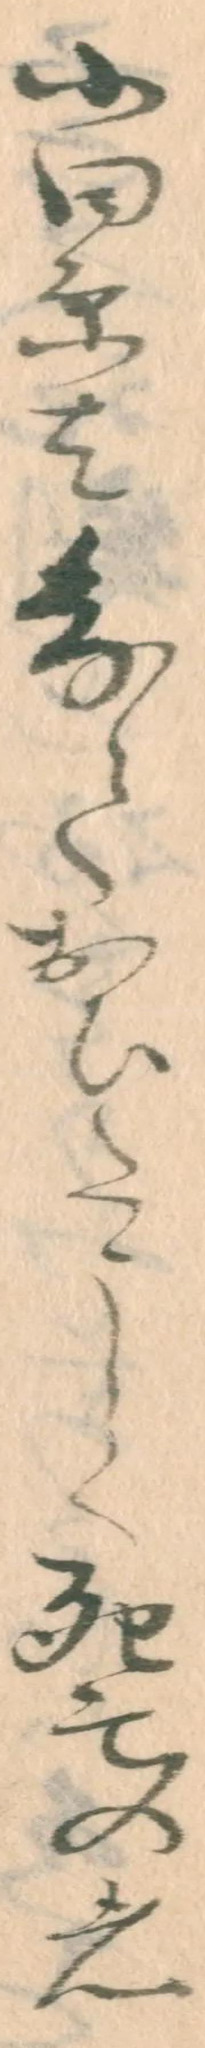小田原は分ておひたゝしく死亡の者
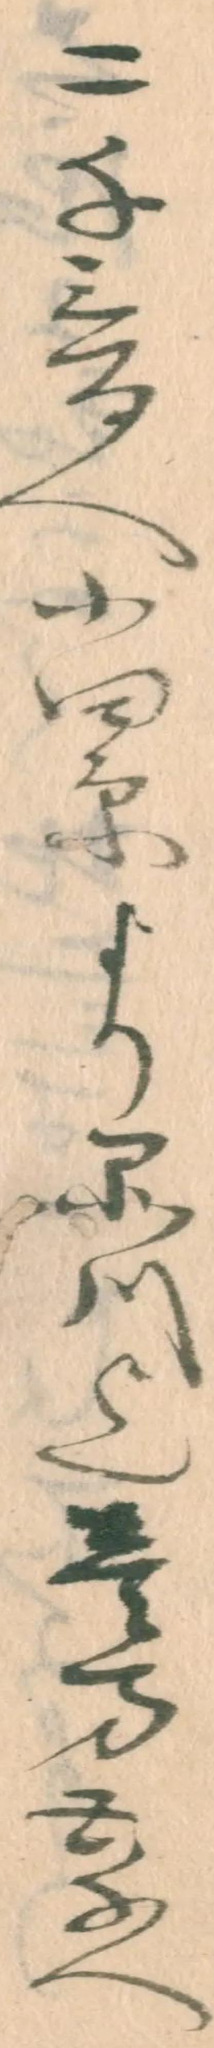二千三百人小田原より品川迄壱万五千人
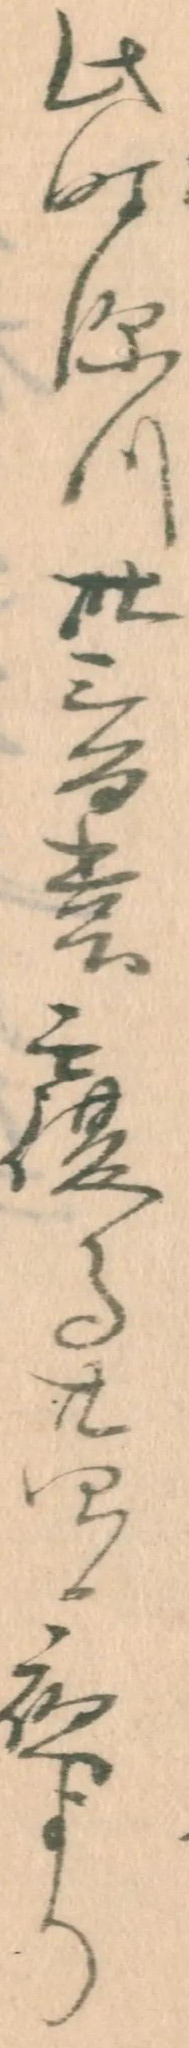此時深川卅三間堂覆る廿四日夜より
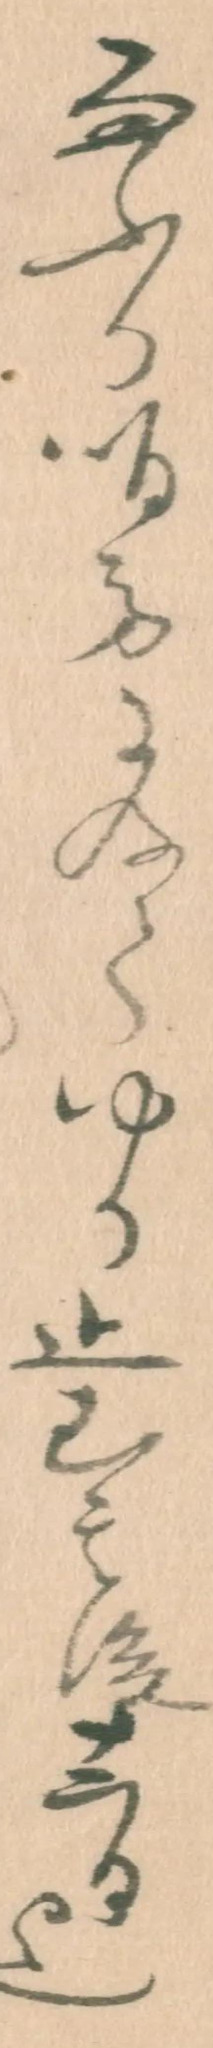雨ふり明方に及てゆり止む其後十二日迄
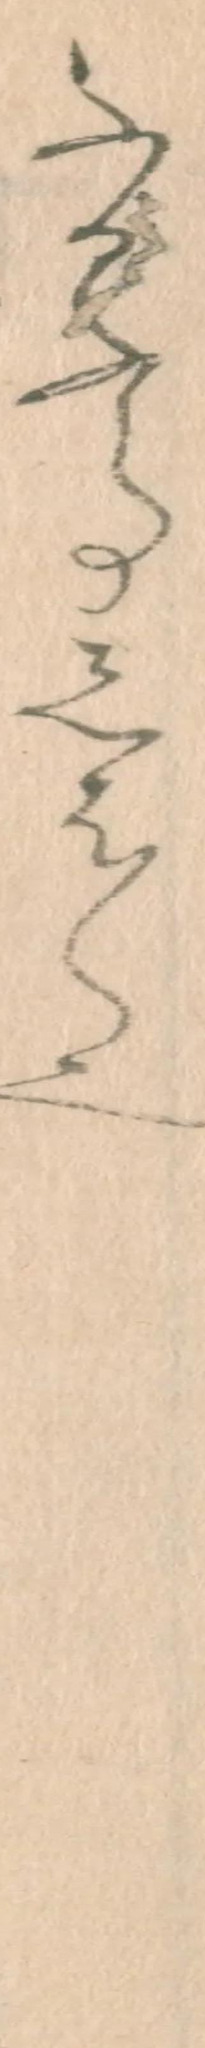ふるふ事しは〳〵也
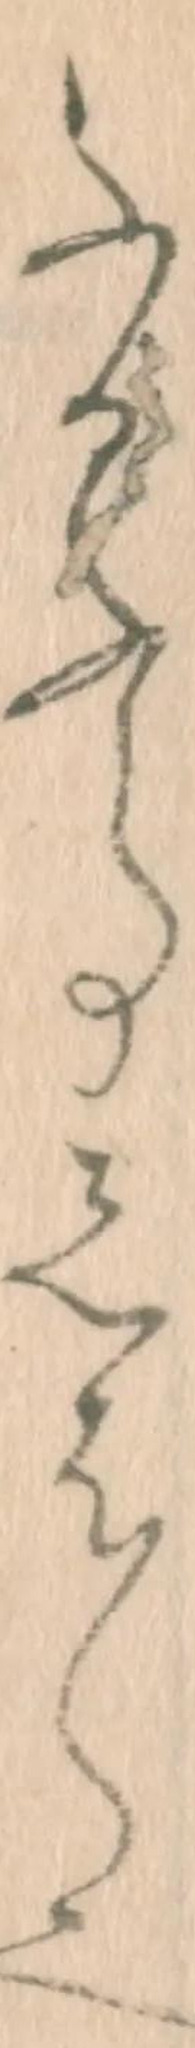ふるふ事しは〳〵也
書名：地震災書留 2巻. [1] 内表紙に「地震災書留　安政二卯年　但本所深川御用屋敷地代免除調」とあり
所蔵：国立国会図書館 National Diet Library, JAPAN
